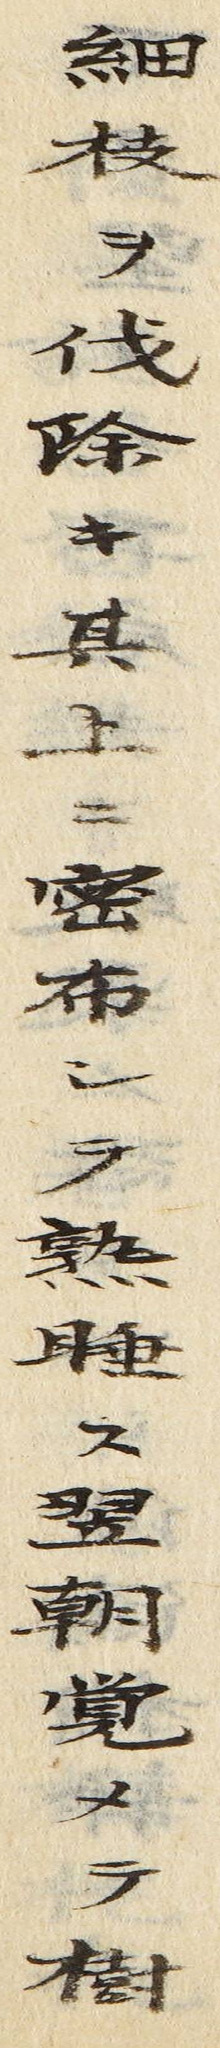細枝ヲ伐除キ其上ニ密布シテ熟睡ス翌朝覚メテ樹

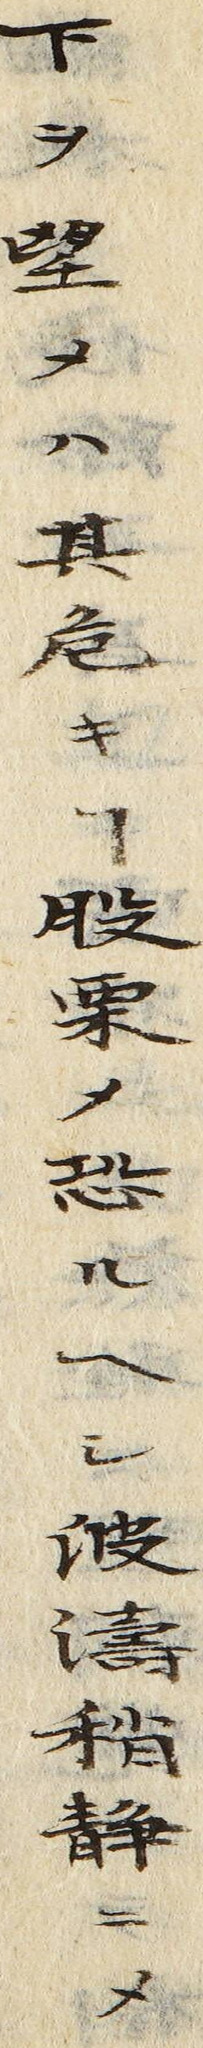下ヲ望メハ其危キコト股栗シテ恐ルヘシ波濤稍静ニシテ
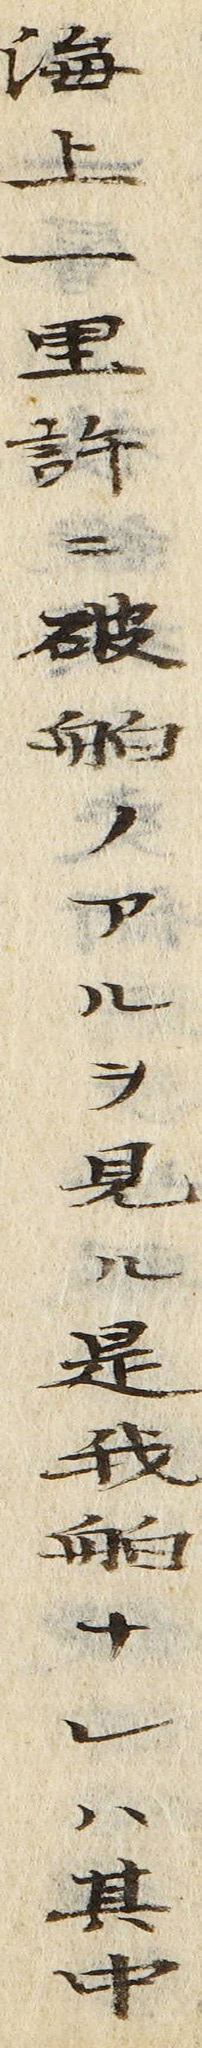海上一里許ニ破舶ノアルヲ見ル是我舶ナレハ其中
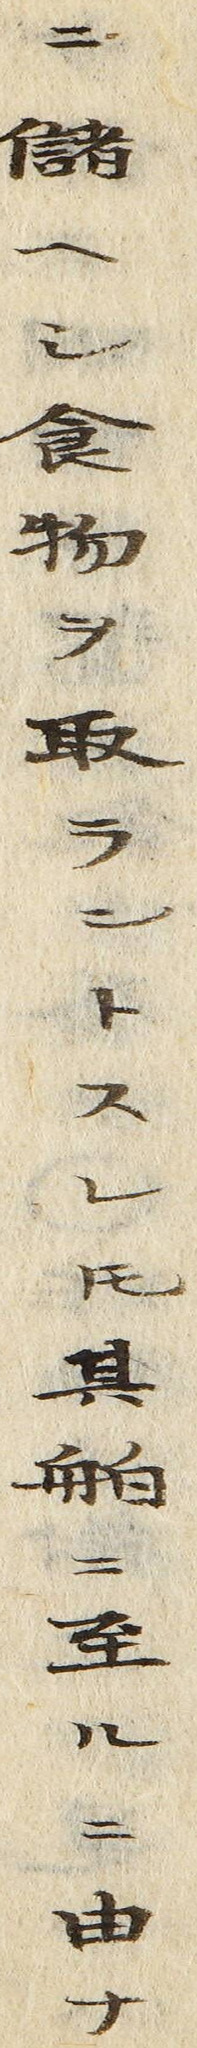ニ儲ヘシ食物ヲ取ラントスレトモ其舶ニ至ルニ由ナ
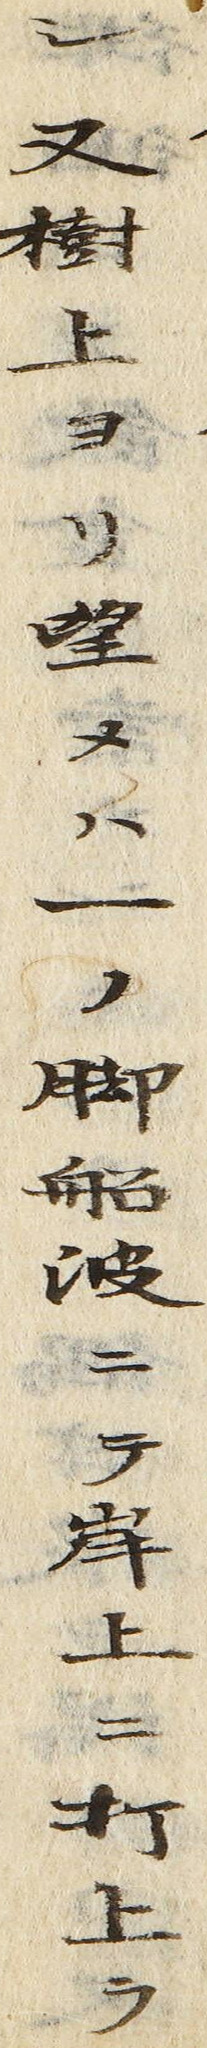シ又樹上ヨリ望メハ一ノ脚船波ニテ岸上ニ打上ラ
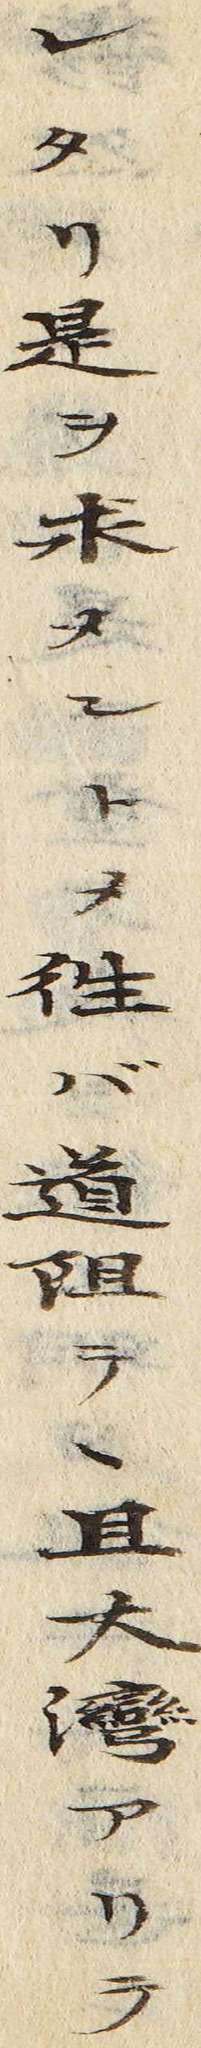レタリ是ヲ求メントシテ往バ道阻テヽ且大湾アリテ
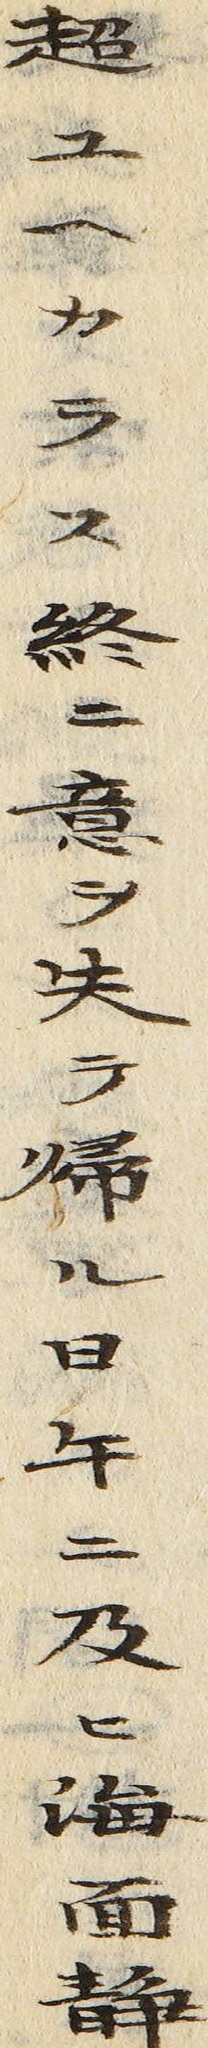超ユヘカラス終ニ意ヲ失テ帰ル日午ニ及ヒ海面静
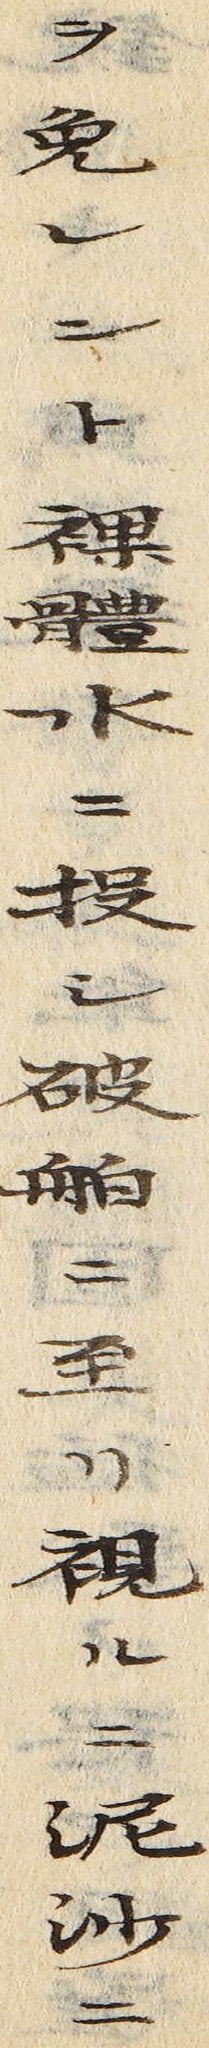ヲ免レント裸体水ニ投シ破舶ニ至リ視ルニ泥沙ニ
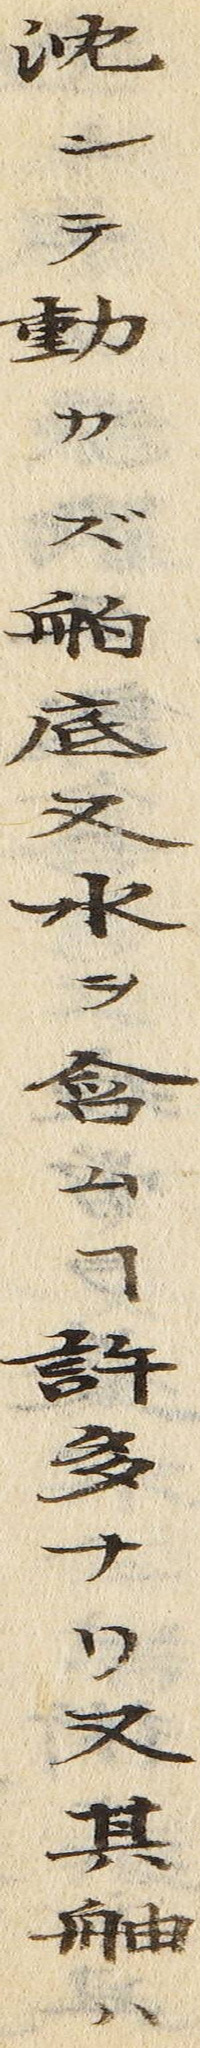沈ンテ動カズ舶底又水ヲ含ムコト許多ナリ又其舳ハ
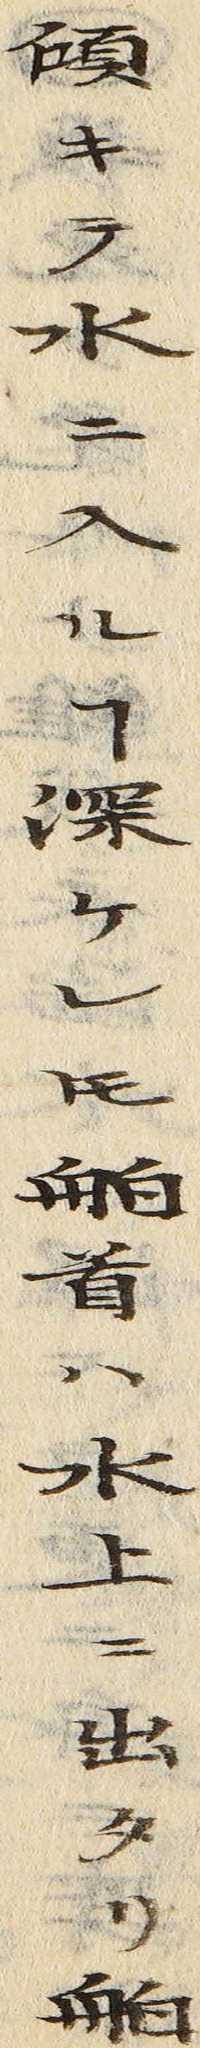傾キテ水ニ入ルコト深ケレトモ舶首ハ水上ニ出タリ舶
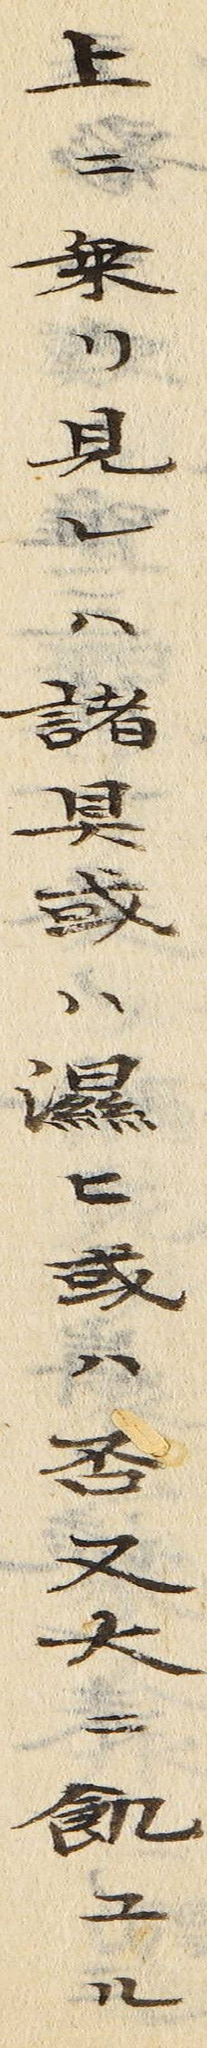上ニ乗リ見レハ諸具或ハ湿ヒ或ハ否又大ニ飢ユル
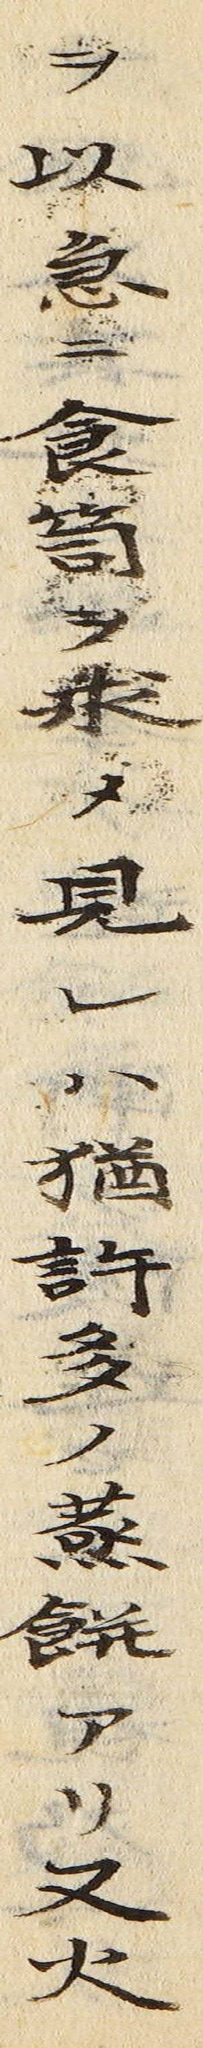ヲ以急ニ食笥ヲ求メ見レハ猶許多ノ蒸餅アリ又火
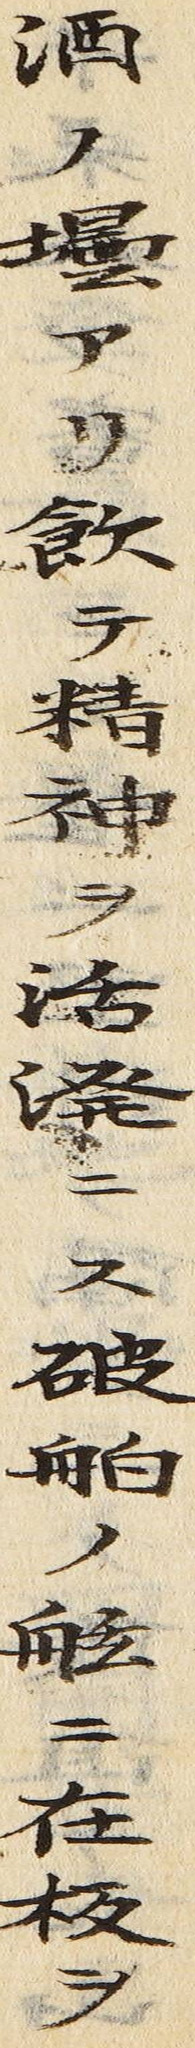酒ノ壜アリ飲テ精神ヲ活溌ニス破舶ノ舷ニ在板ヲ
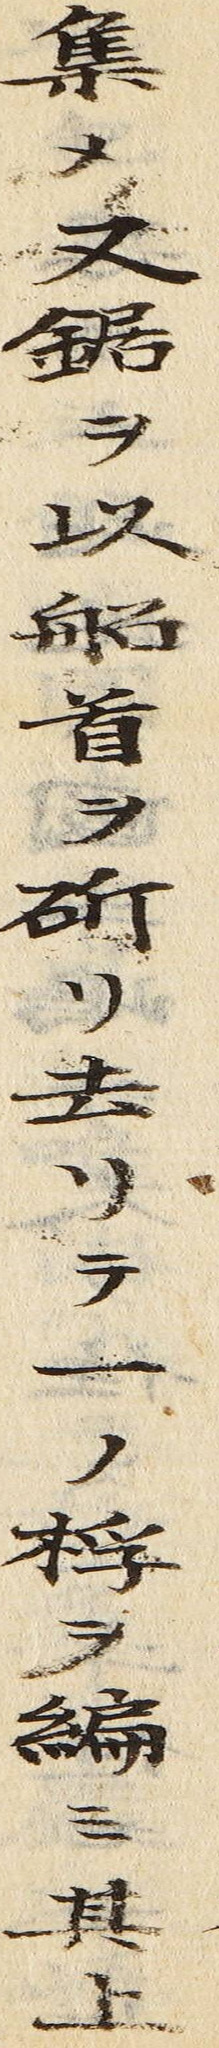集メ又鋸ヲ以船首ヲ斫リ去リテ一ノ桴ヲ編ミ其上
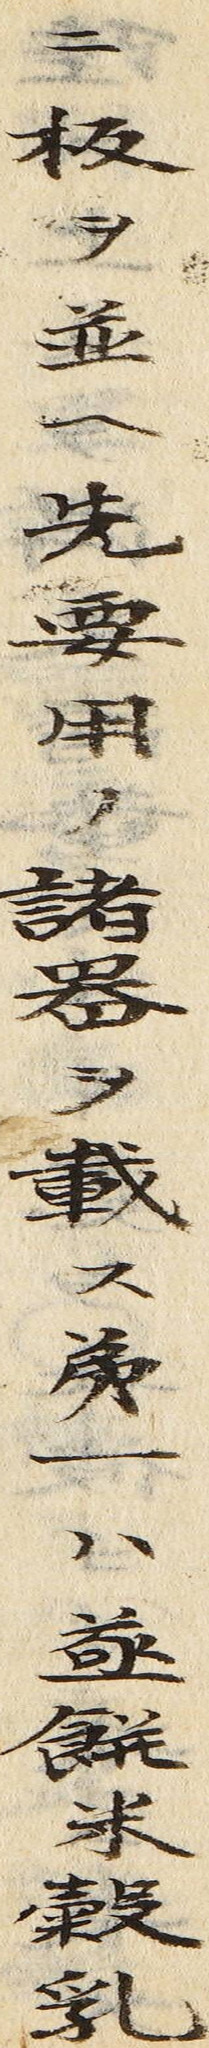ニ板ヲ並ヘ先要用ノ諸器ヲ載ス第一ハ蒸餅米穀乳
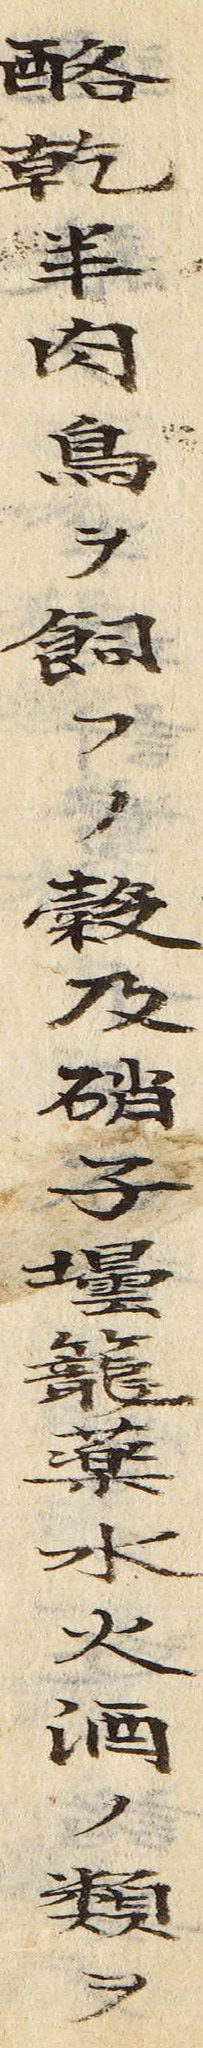酪乾羊肉鳥ヲ飼フノ穀及硝子壜籠薬水火酒ノ類ヲ
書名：漂流紀事
